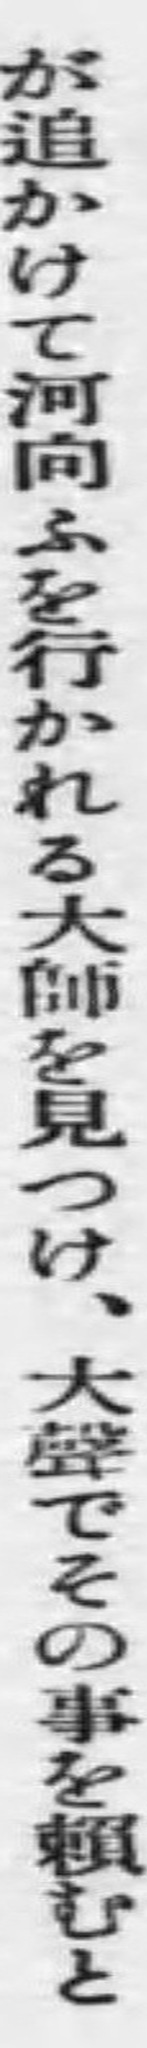が追かけて河向ふを行かれる大師を見つけ、大聲でその事を賴むと
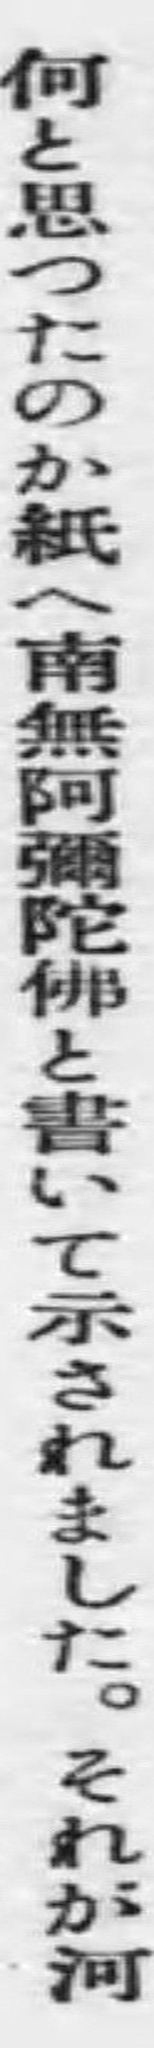何と思つたのか紙へ南無阿彌陀佛と書いて示されました。それが河
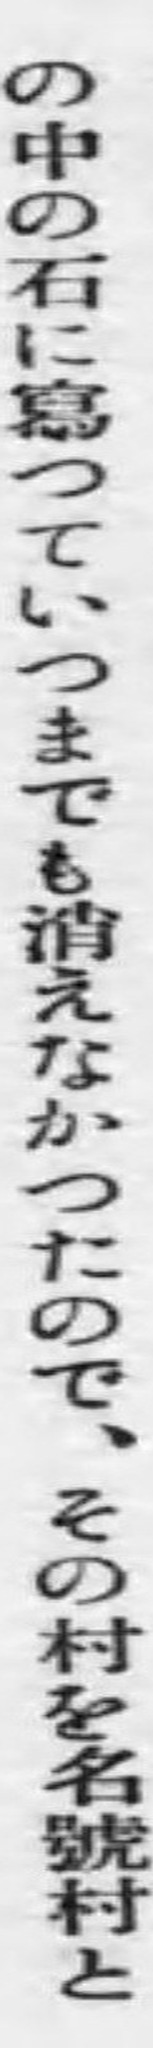の中の石に寫つていつまでも消えなかつたので、その村を名號村と
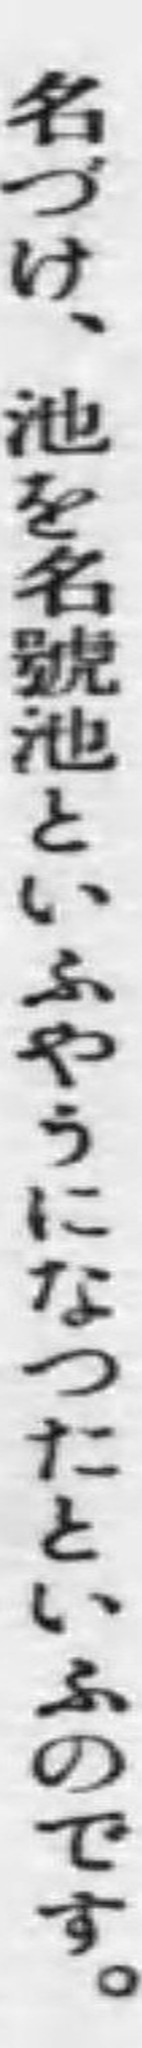名づけ、池を名號池といふやうになつたといふのです。
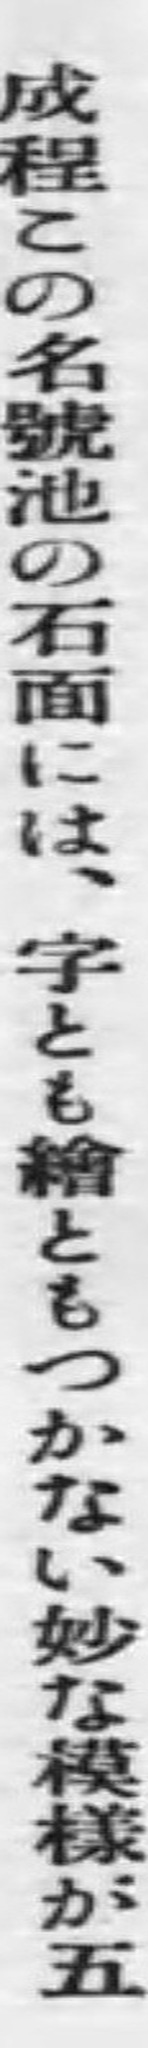成程この名號池の石面には、字とも繪ともつかない妙な模樣が五
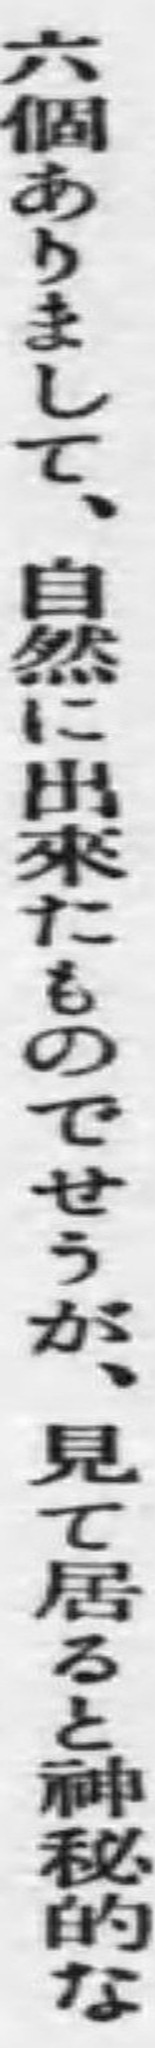六個ありまして、自然に出來たものでせうが、見て居ると神秘的な

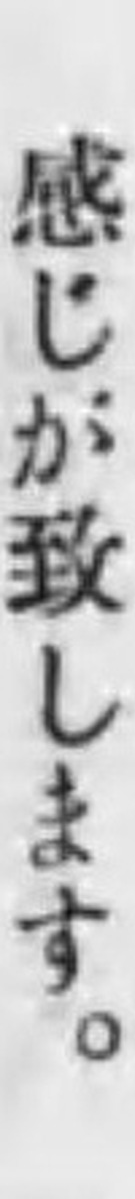感じが致します。
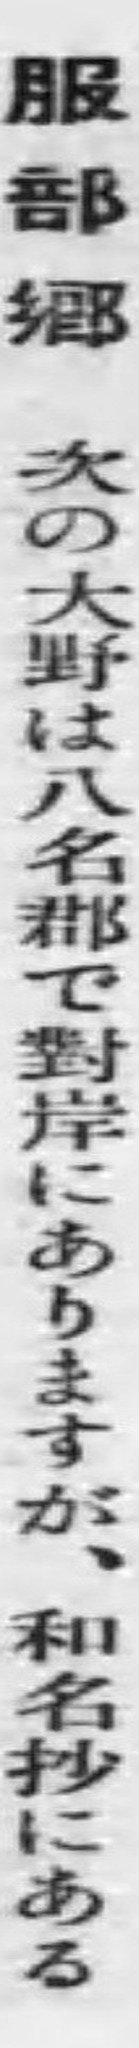服部郷次の大野は八名郡で對岸にありますが、和名抄にある
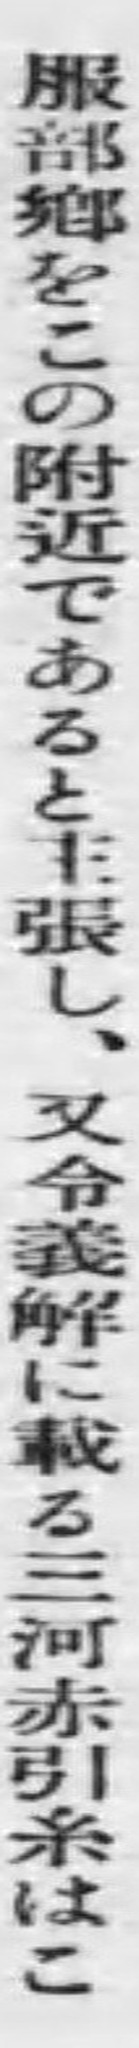服部郷をこの附近であると主張し、又令義解に載る三河赤引糸はこ
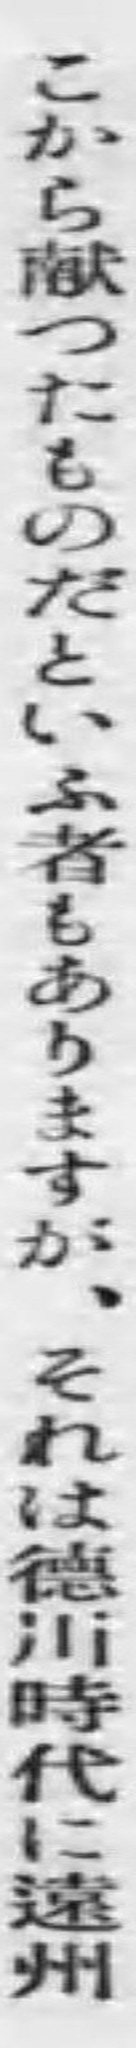こから献つたものだといふ者もありますが、それは徳川時代に遠州
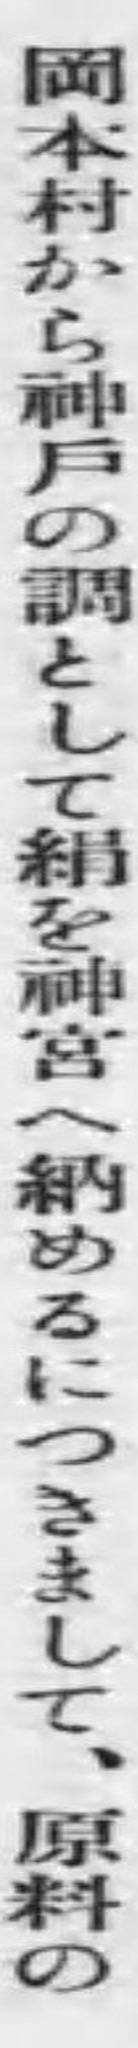岡本村から神戸の調として絹を神宮へ納めるにつきまして、原料の
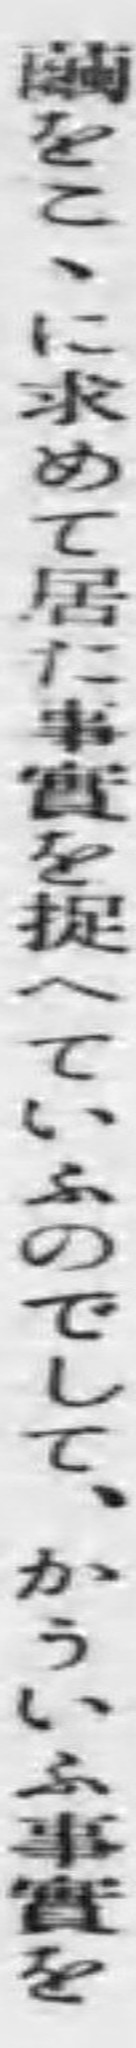繭をこヽに求めて居た事實を捉へていふのでして、かういふ事實を
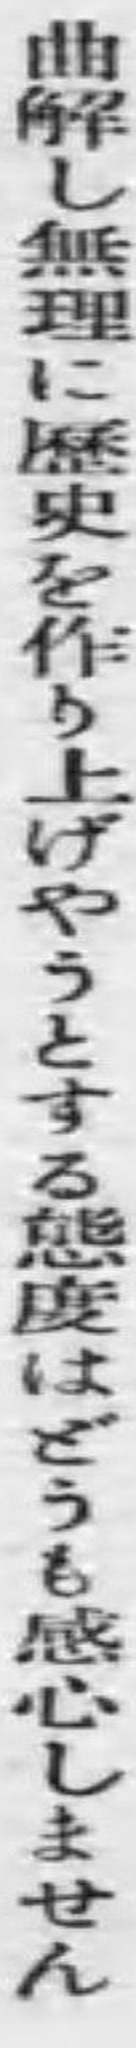曲解し無理に歴史を作り上げやうとする態度はどうも感心しません
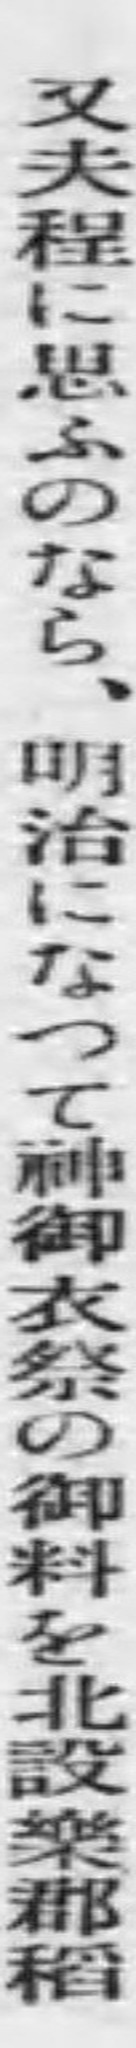又夫程に思ふのなら、明治になつて神御衣祭の御料を北設樂郡稲
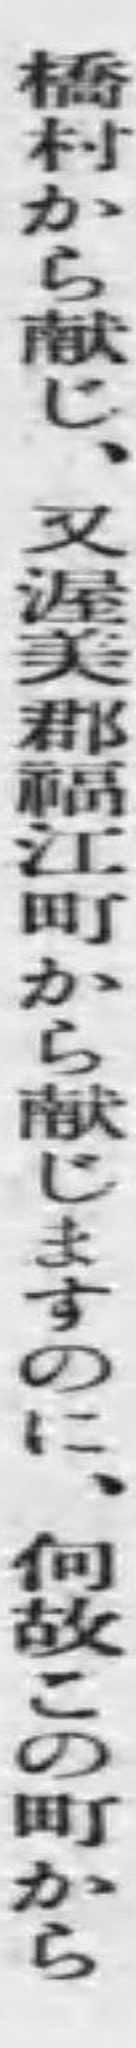橋村から献じ、又渥美郡福江町から献じますのに、何故この町から
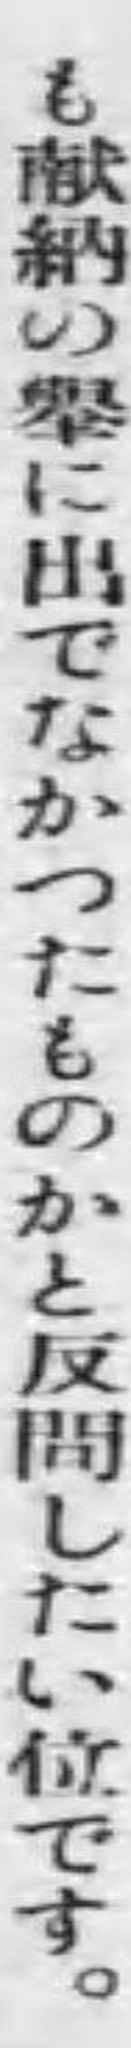も献納の舉に出でなかつたものかと反問したい位です。
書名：東三河道中記 : 豊橋市及其附近案内
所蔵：国立国会図書館 National Diet Library, JAPAN
